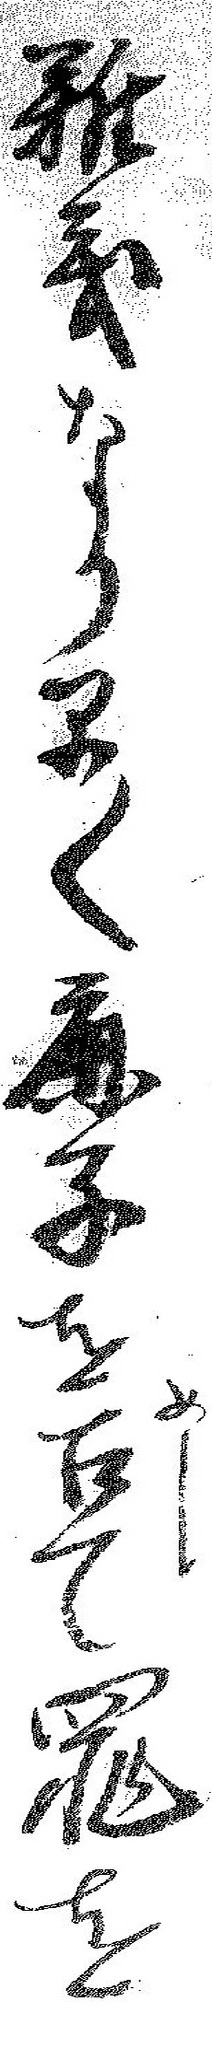難義なり早〳〵鹿子を召て罪を
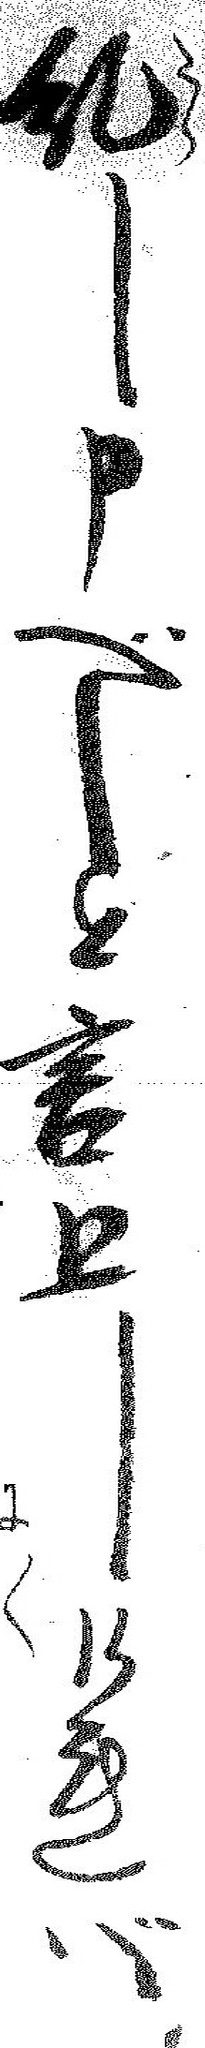糺し申べしと言上しければ
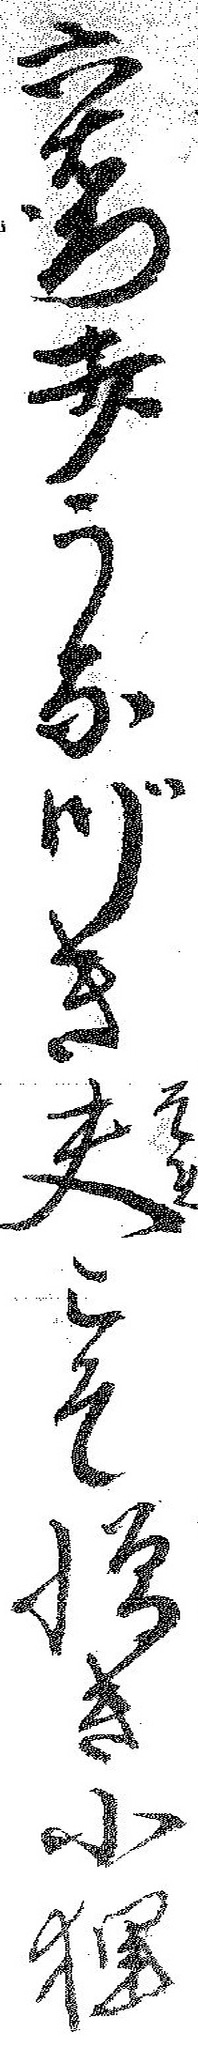六右衛門打うなづき夫こそ憎き小狸
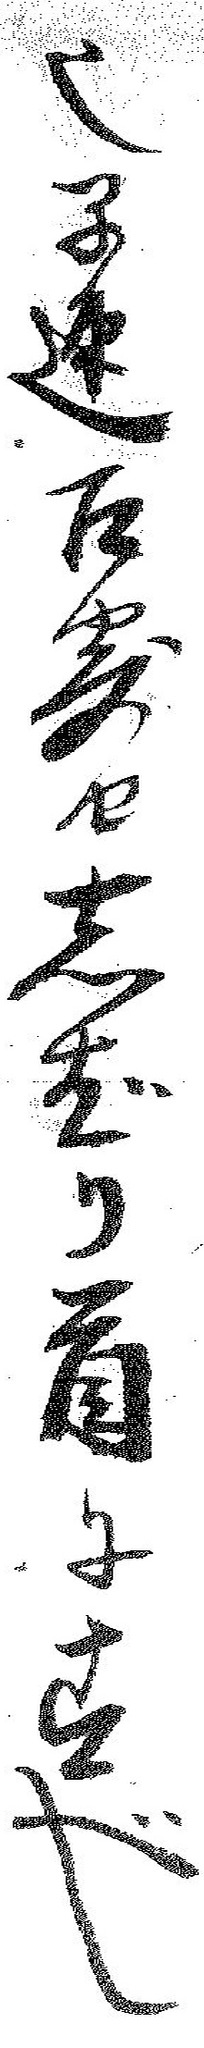也早速召寄せしばり首にすべし
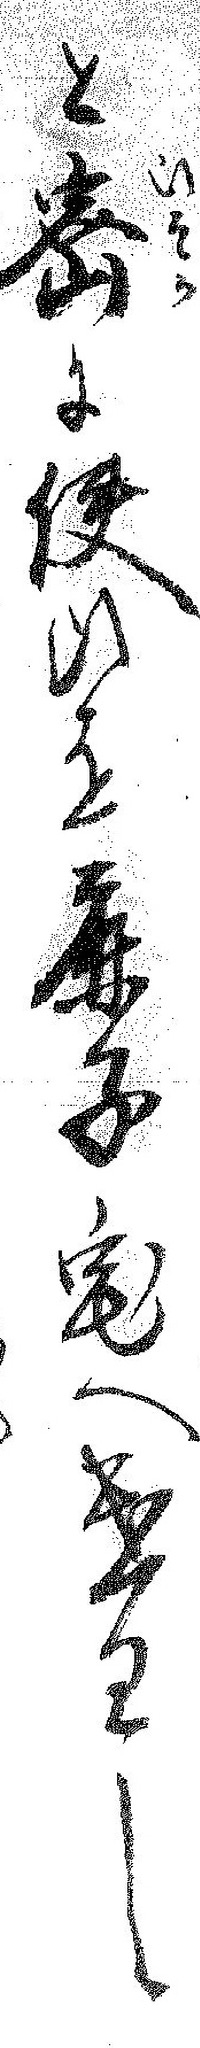と密に使ひを鹿子宅へ遣わし
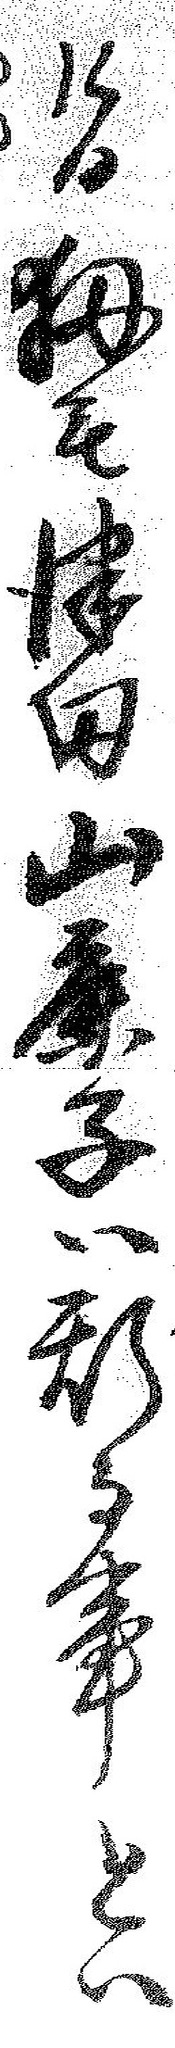ける扨も津田山鹿子は斯る事とは
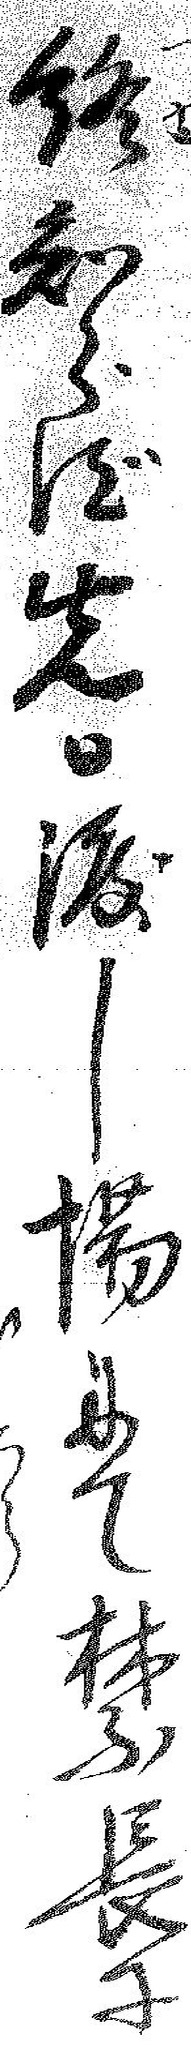終知らず先日渡し場にて禁長に
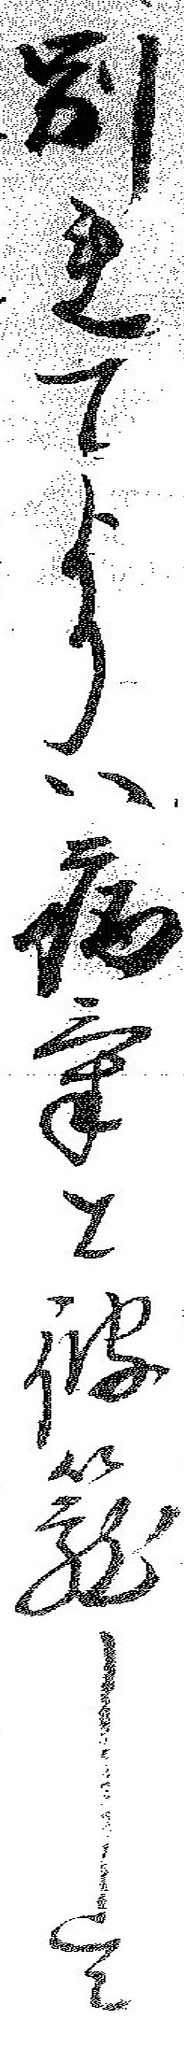別れてよりは病気と披籠して
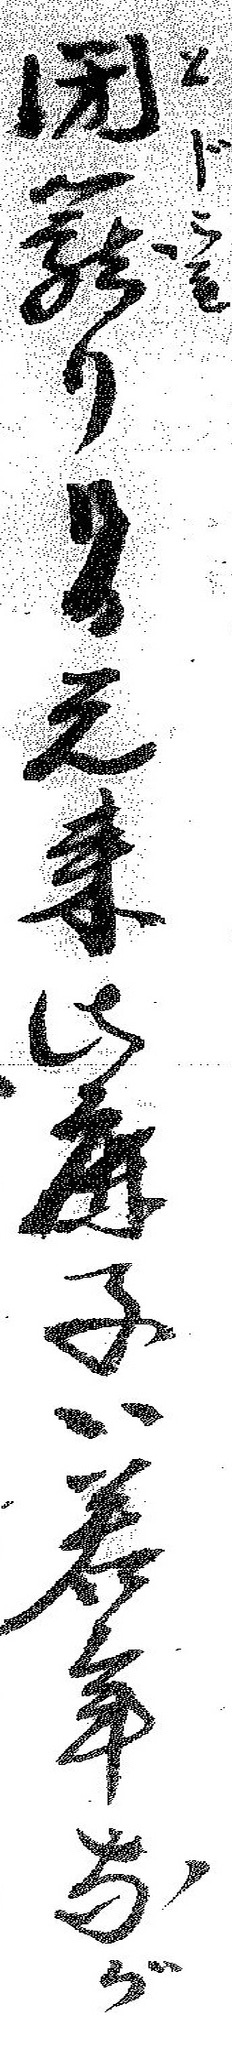閉籠りける元来此鹿子は若年なが
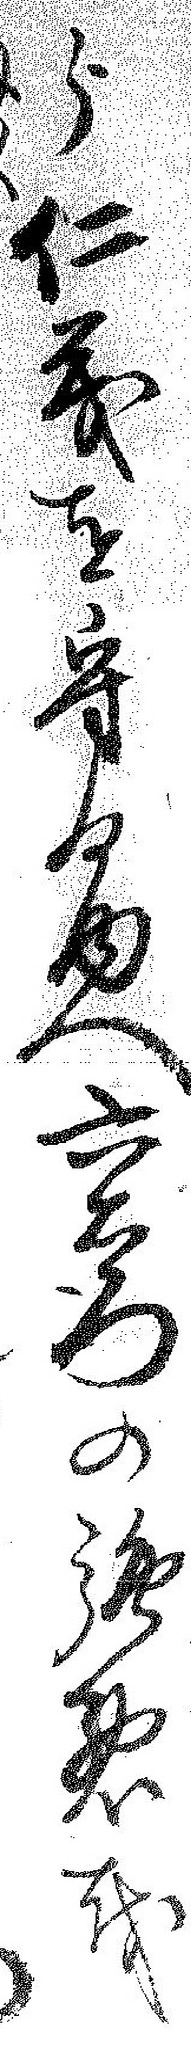ら仁義を守るゆへ六右衛門の強烈を
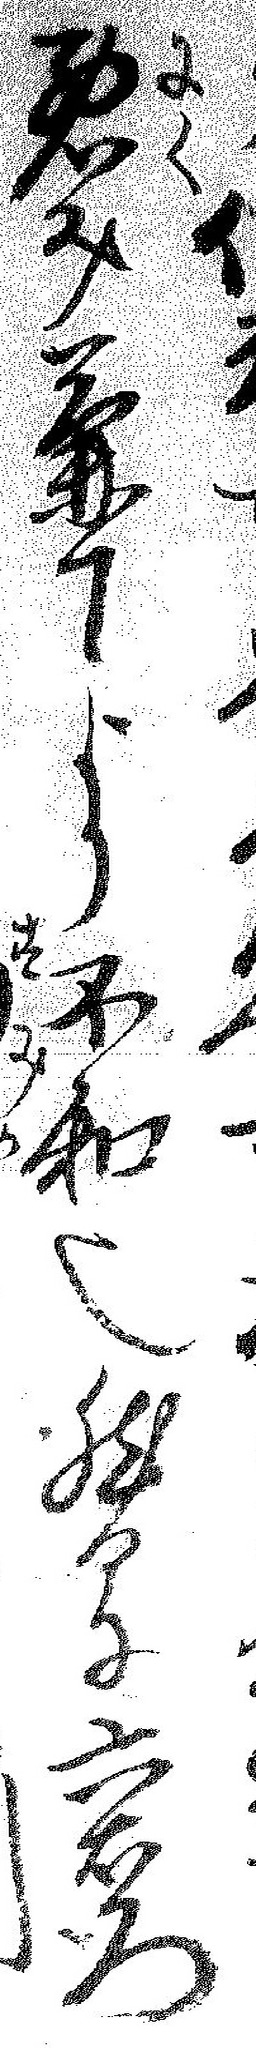悪み兼てより不和なり然るに六右衛門
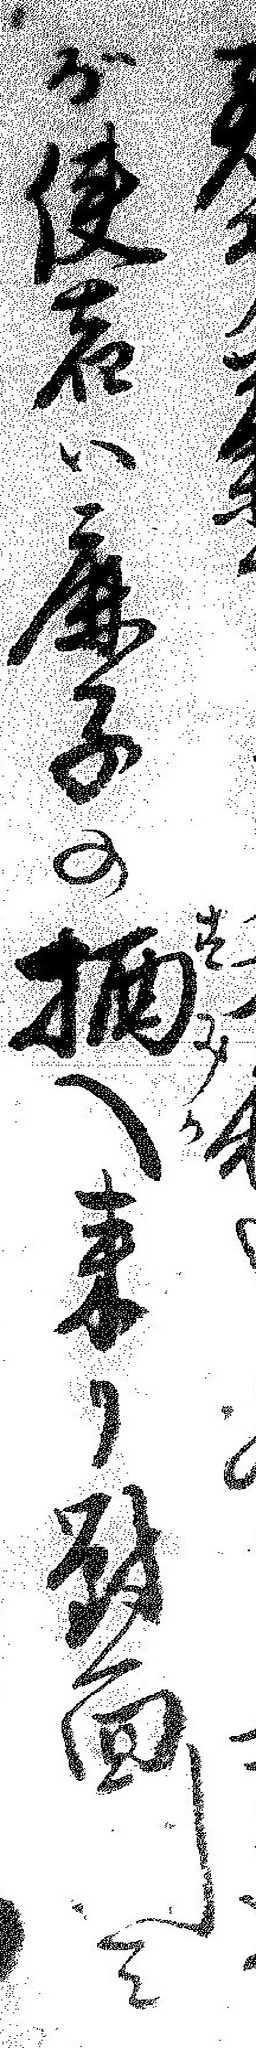が使者は鹿子の栖へ来り対面して
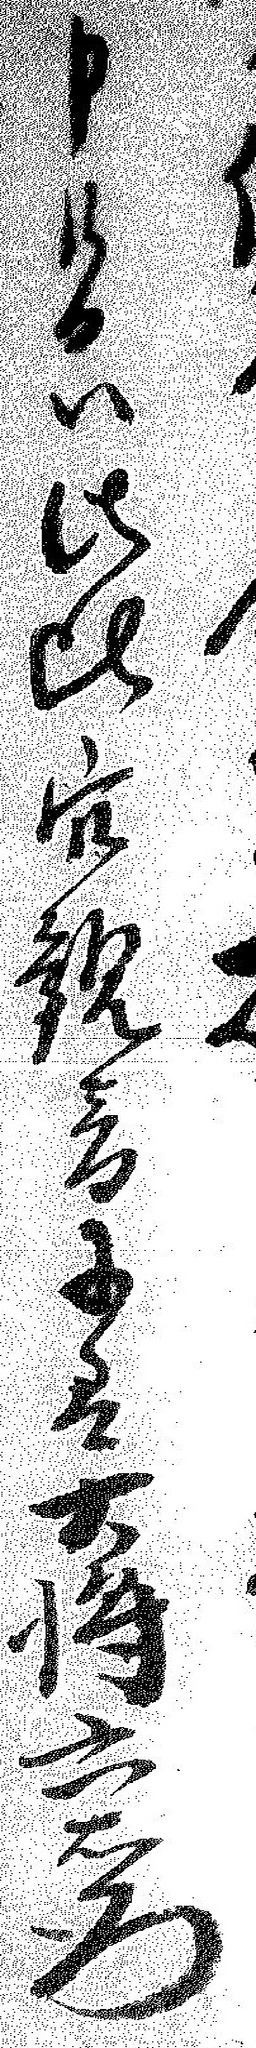申けるは此頃穴観音には大将六右衛門

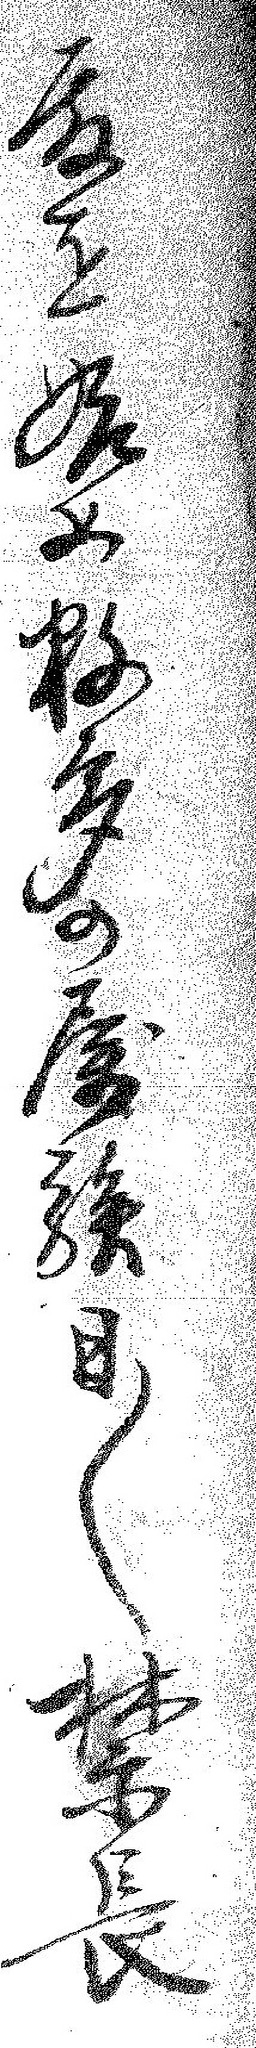殿を始め数多の属族日〳〵禁長
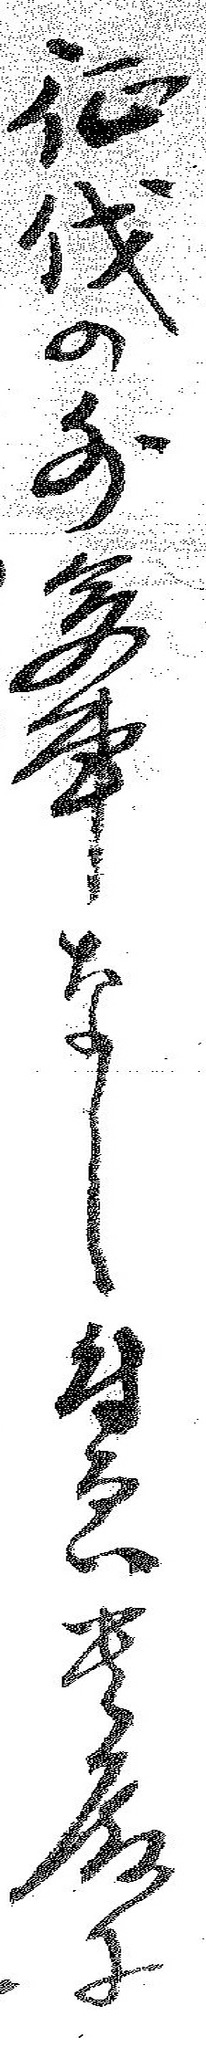征伐の外多事なし付而は貴殿に
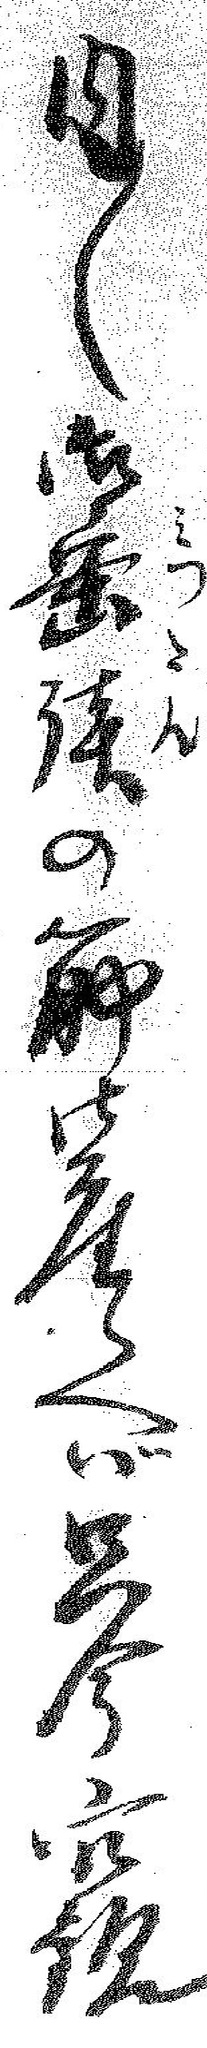内〳〵御密談の筋御座候へば只今穴観
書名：近頃古狸珍説　礼義智信
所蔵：徳島県立図書館
